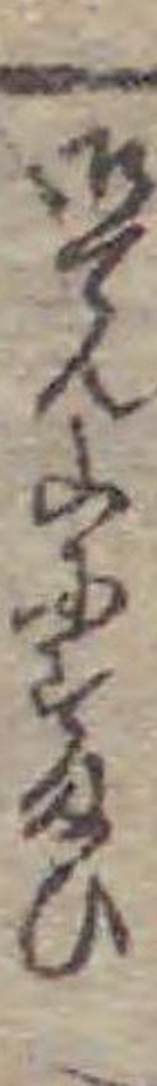御てん山にすまひ
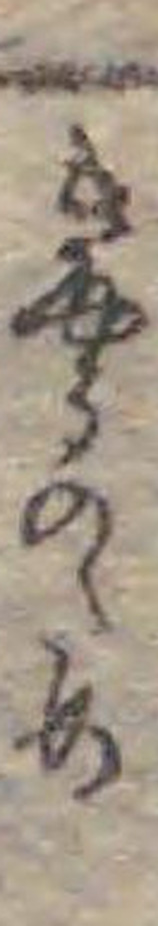きやうのため
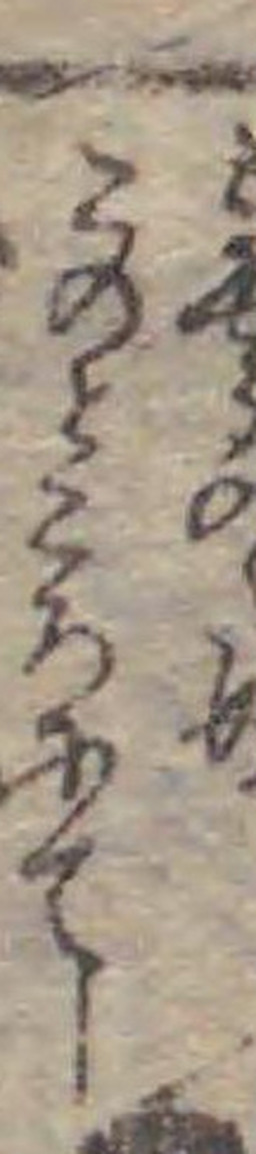このところにて
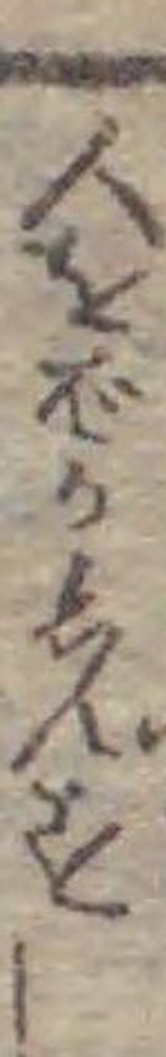人をばかしんす
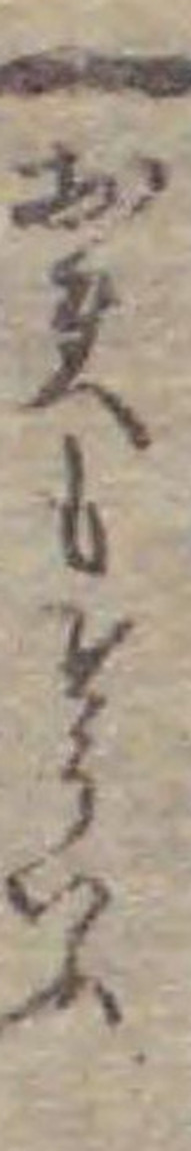おまへもそういふ
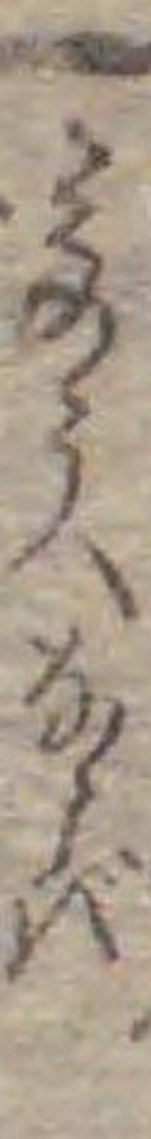みのうへならば
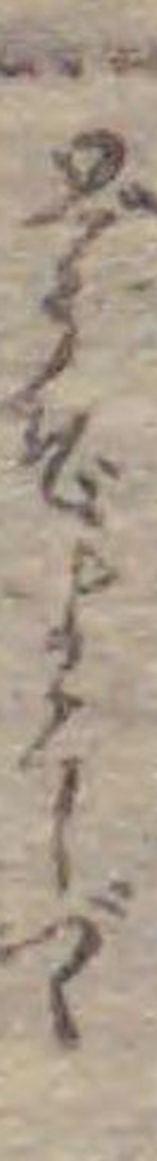どうぞすこしづゝ
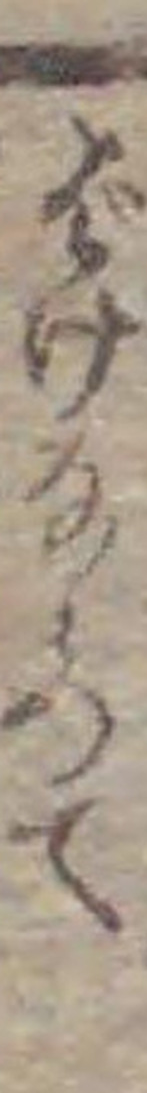ばけならつて
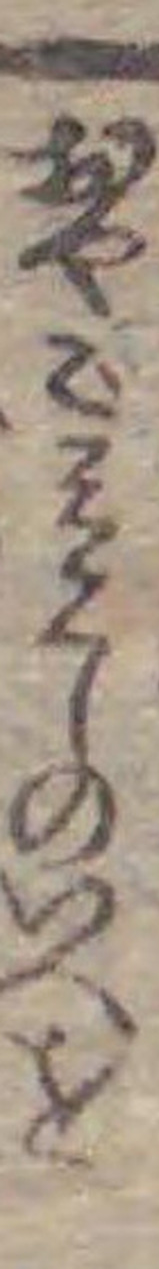おやごみこしのいへを
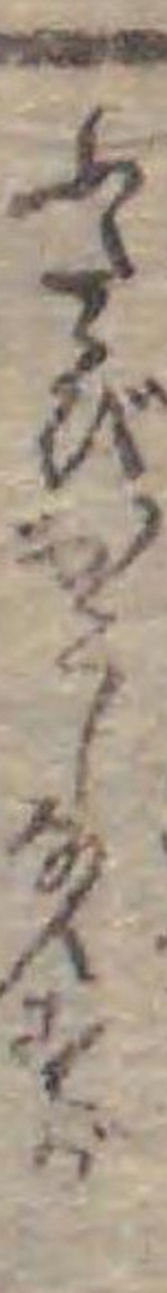ふたたびおこしなんすが
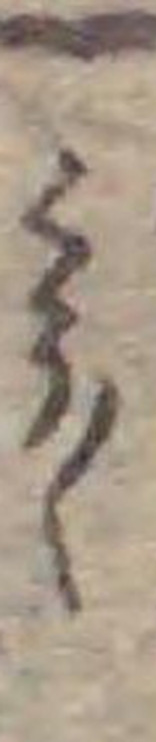こう〳〵
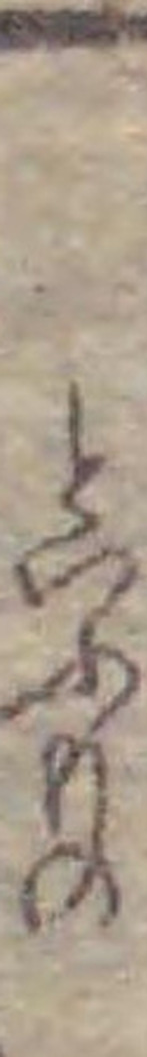といふもの
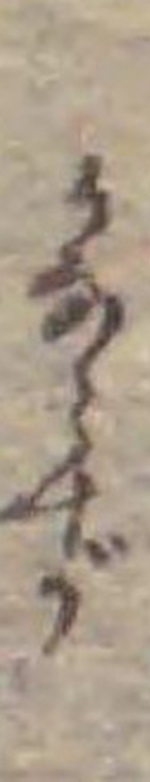かならず
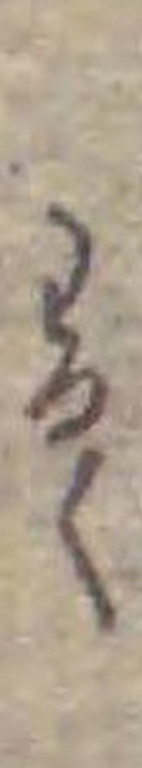わるく
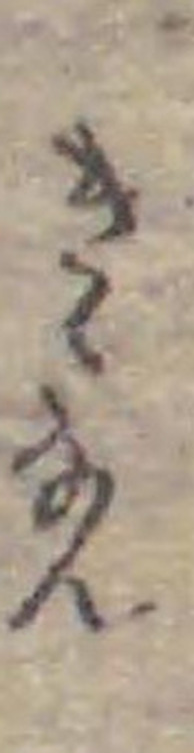きゝなん

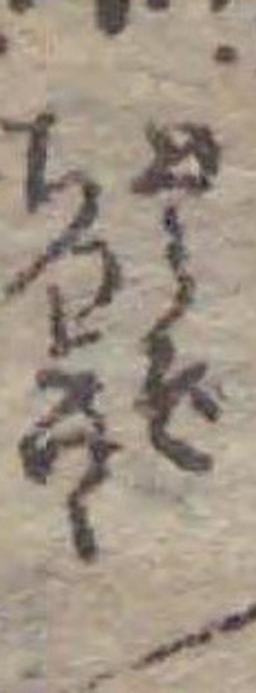ちつといく
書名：[化物一代記] : 5巻
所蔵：国立国会図書館 National Diet Library, JAPAN
